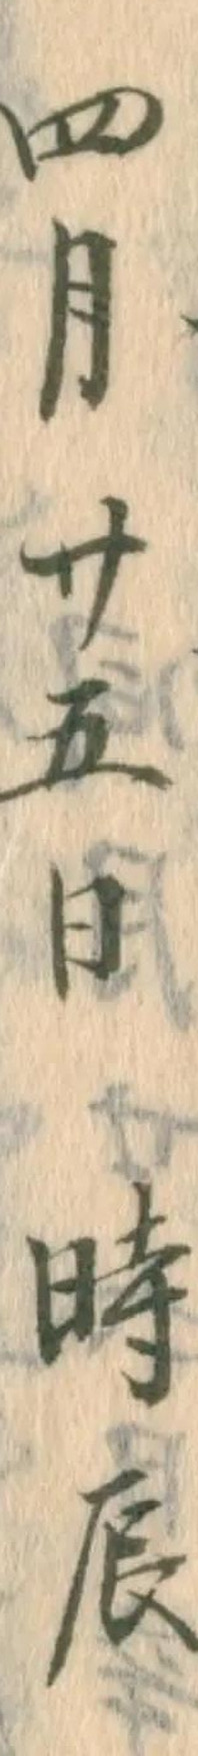四月廿五日時辰
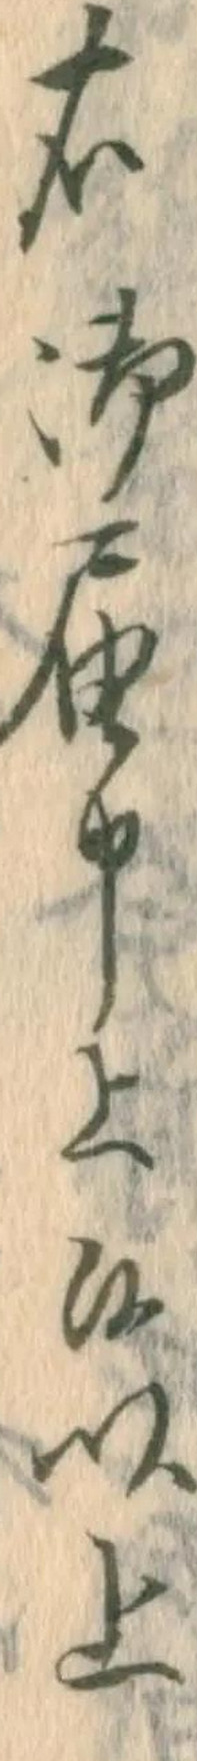右御届申上候以上
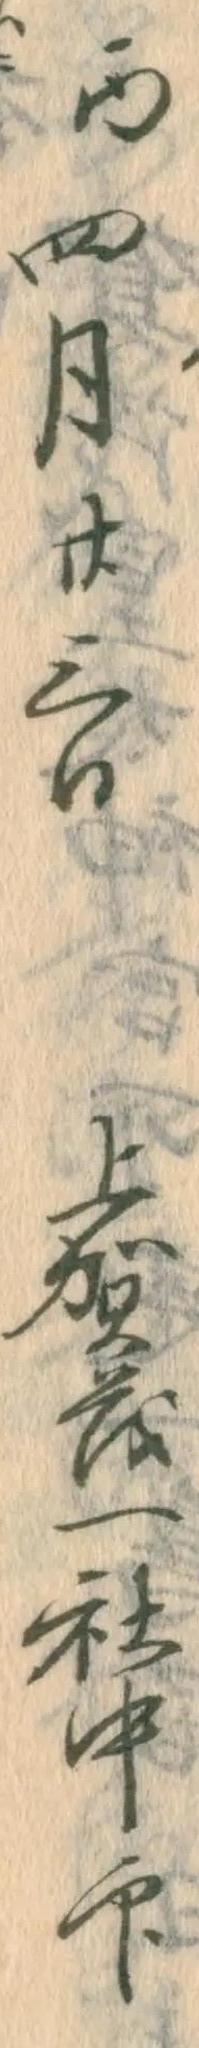酉四月廿三日上賀茂一社中印
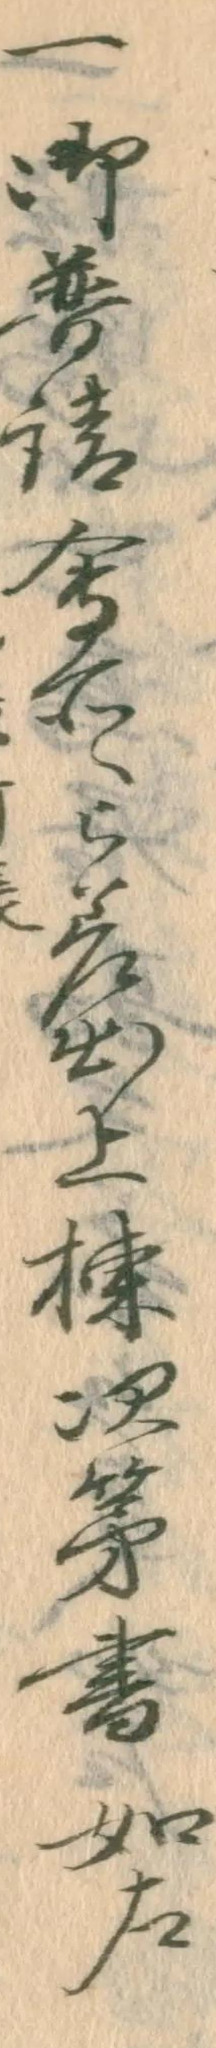一御普請会所へ被差出上棟次第書如左
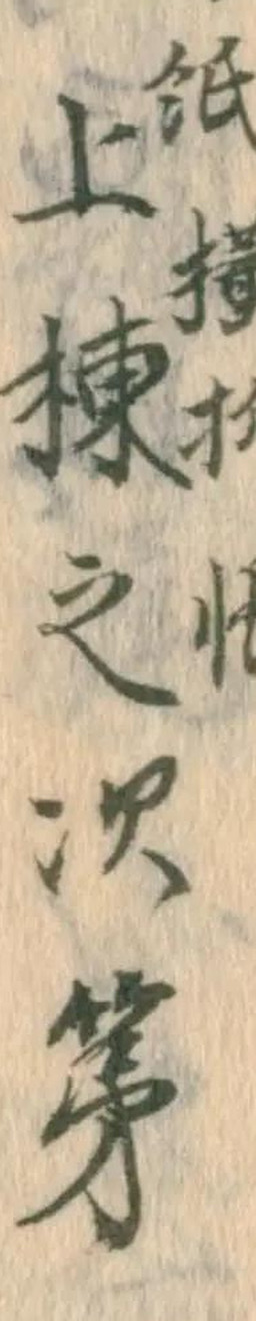上棟之次第
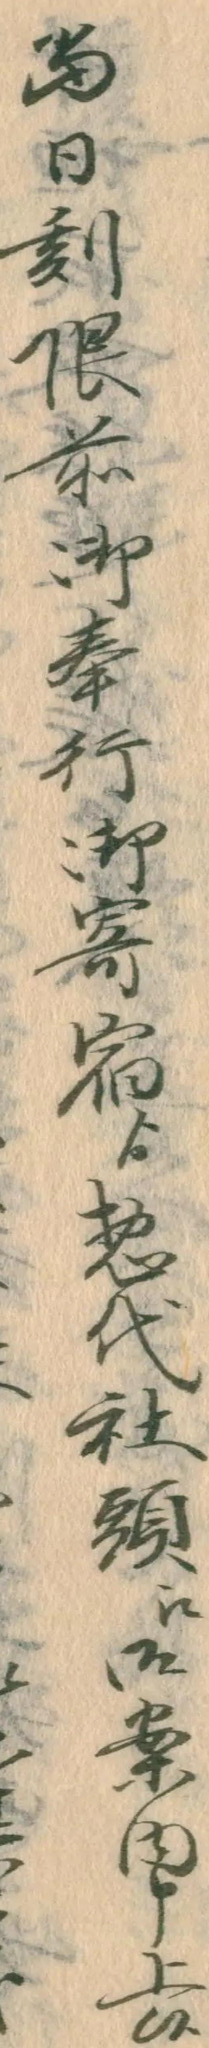当日刻限前御奉行御寄宿ゟ惣代社頭江御案内申上候
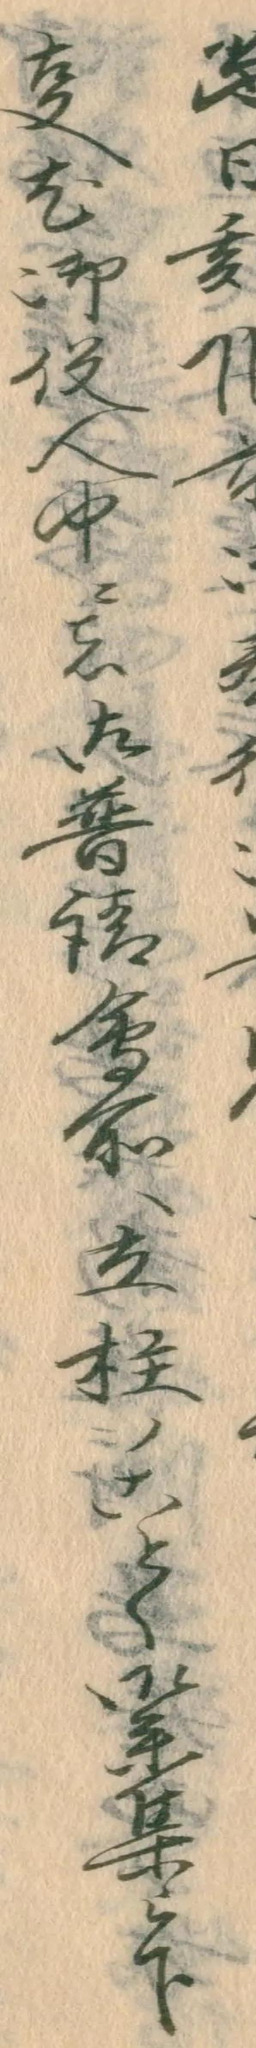事尤御役人中ニは御普請会所へ立柱ノことく御参集被下
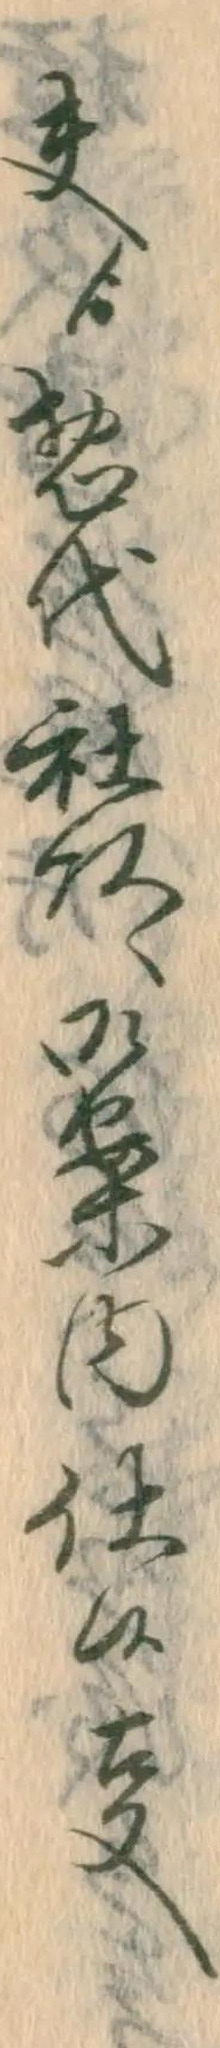夫ゟ惣代社頭へ御案内仕候事
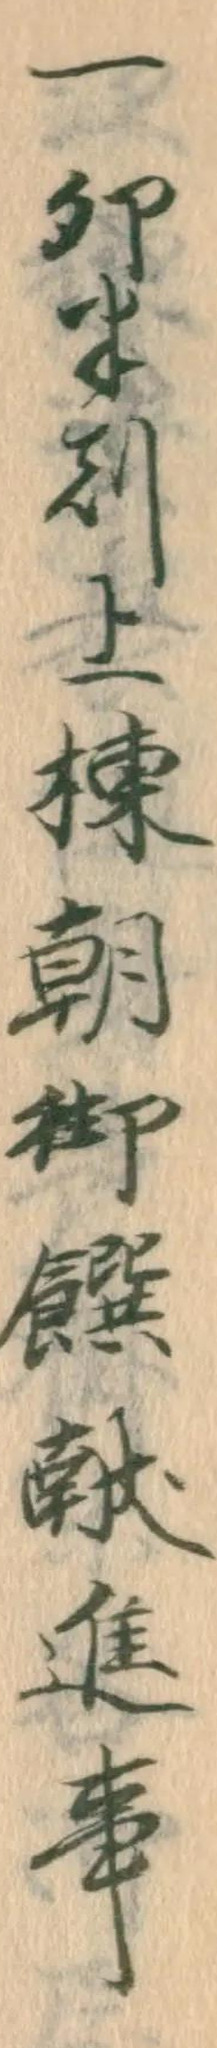一卯半刻上棟朝御饌献進事
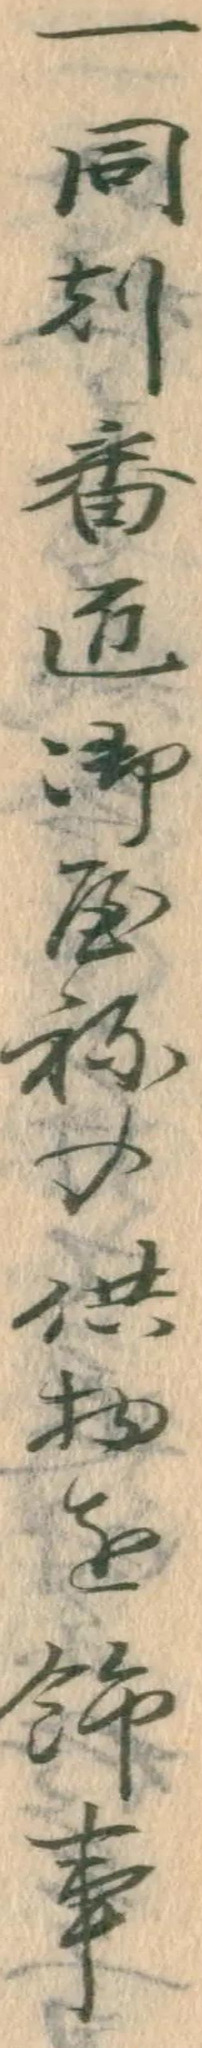一同刻番匠御屋ねの供物を飾事
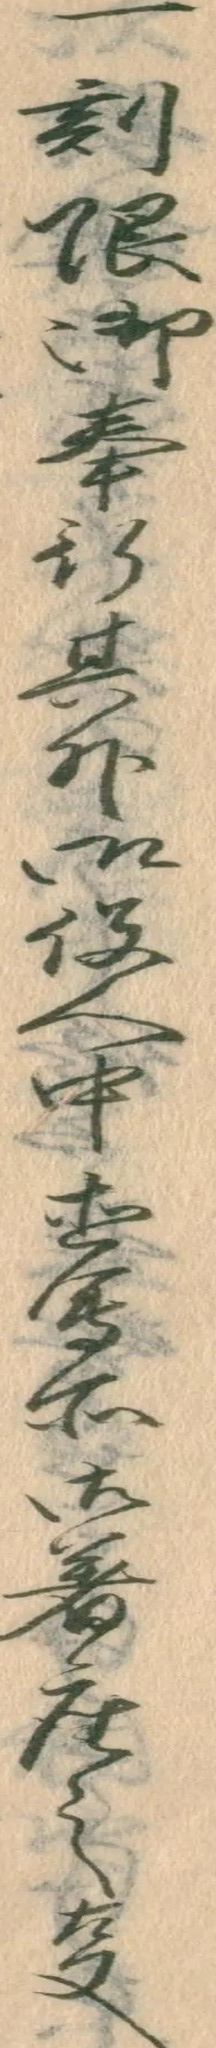一刻限御奉行其外御役人中直会所御着座之事
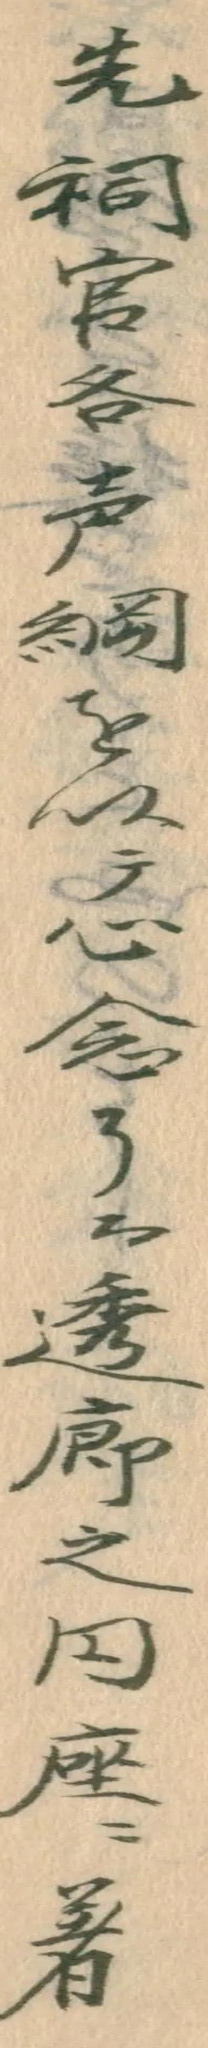先祠宮各声綱を以テ心念了而透廊之同座ニ着
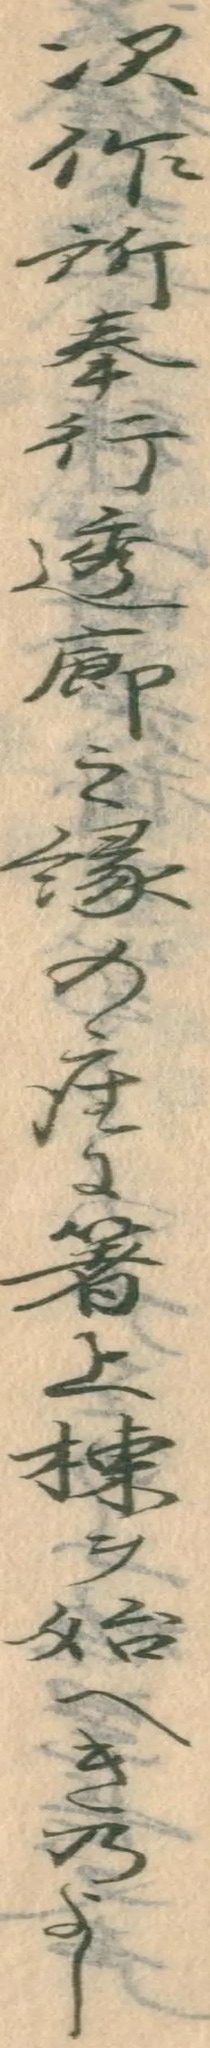次作所奉行透廊之縁の座に箸上棟ヲ始へきのよし
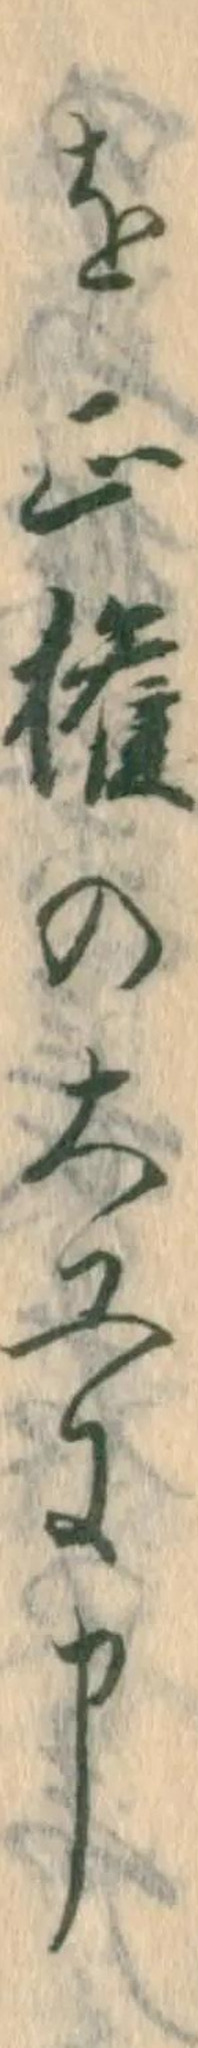を正権の大工に申
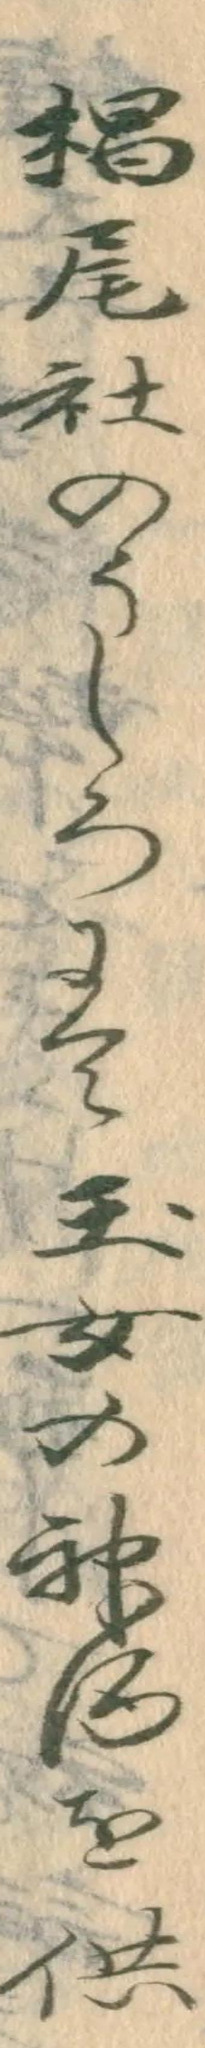椙尾社のうしろにて玉女の神酒を供
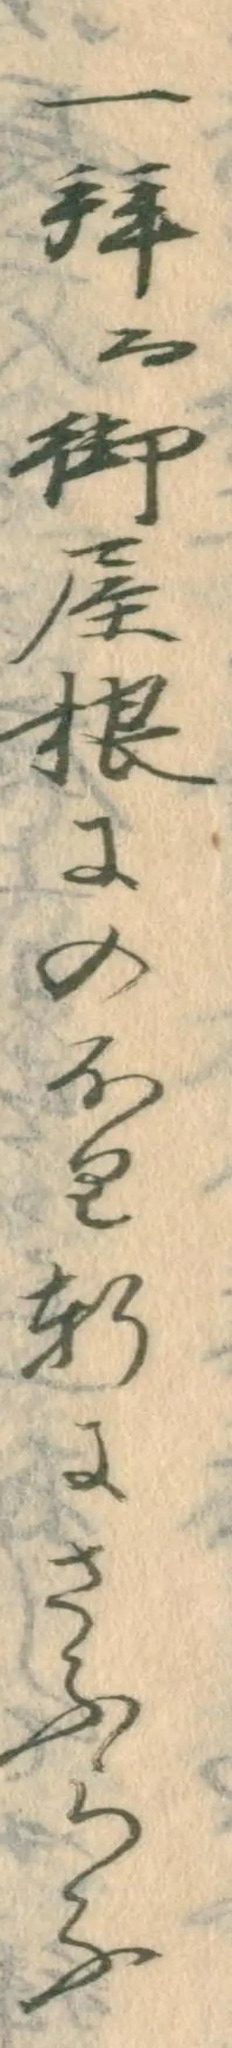一拝而御屋根にのほり軒にさふらふ
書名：賀茂社記録. 第17冊
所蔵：国立国会図書館 National Diet Library, JAPAN
